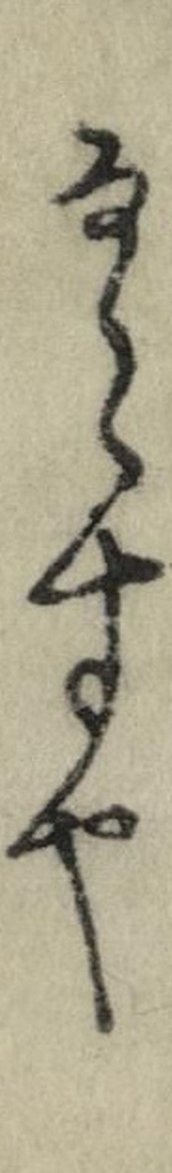ならすや
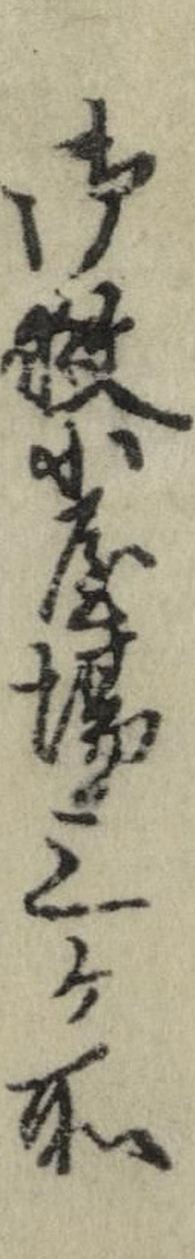一御救小屋場三ケ所
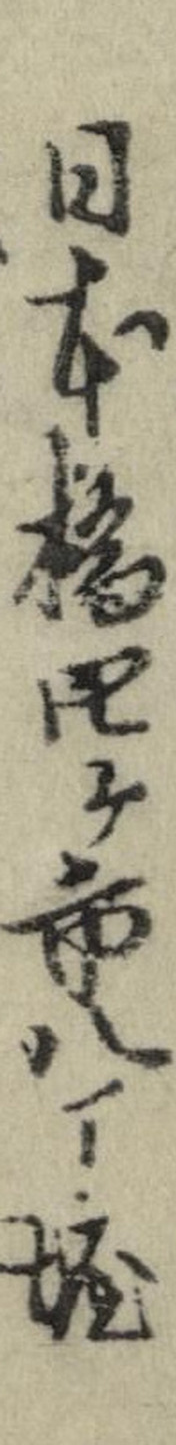日本橋四ケ市八丁堀
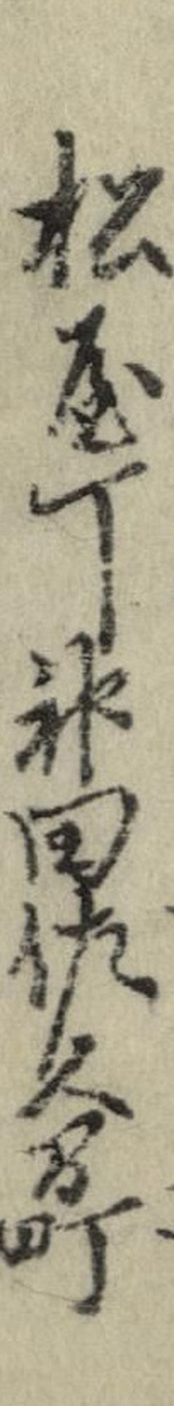松屋丁神田佐久間町
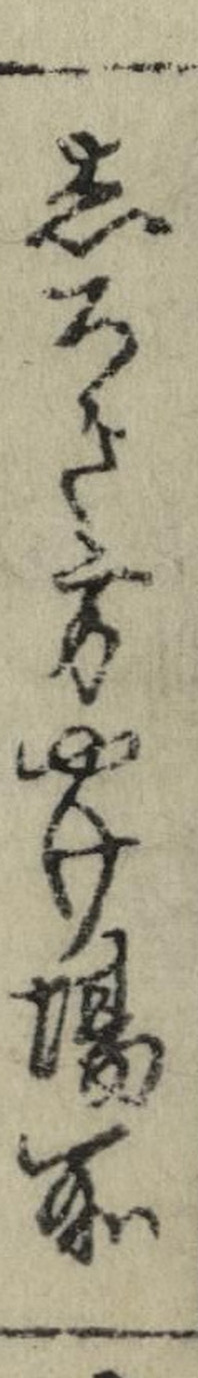しろき方やけ場所
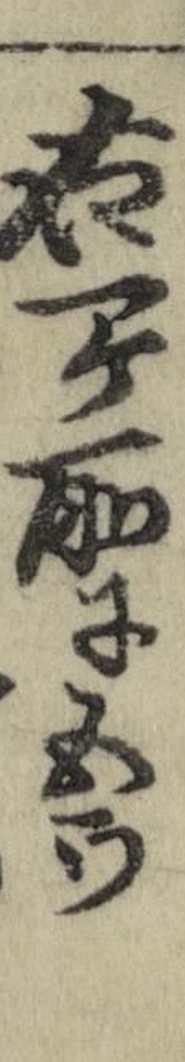右一ヶ所に五ツ
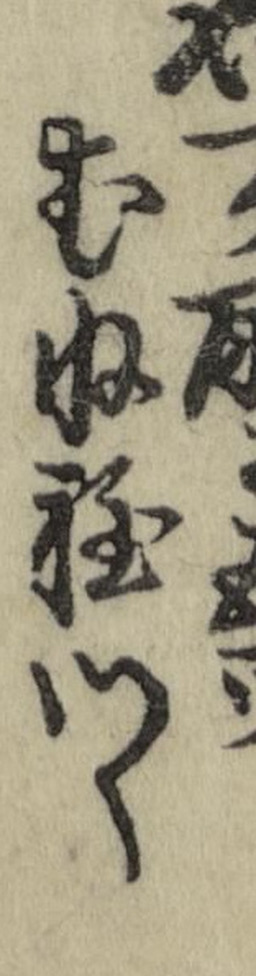むね程ツヽ
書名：[弘化三年一月の江戸大火に関する瓦版]
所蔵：東京大学地震研究所図書室 Earthquake Research Institute Library, The University of Tokyo, JAPAN
